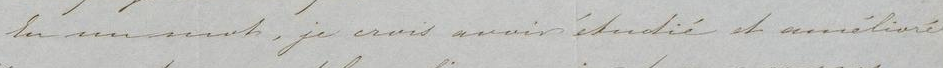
En un mot, je crois avoir étudié et amélioré
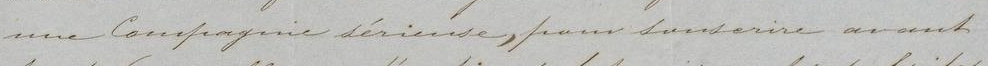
une Compagnie sérieuse, pour souscrire avant
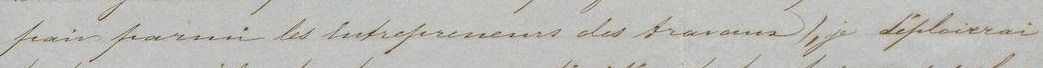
pair parmi les Entrepreneurs des travaux), je déploierai
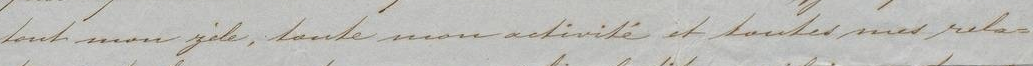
tout mon zèle, toute mon activité et toutes mes rela-
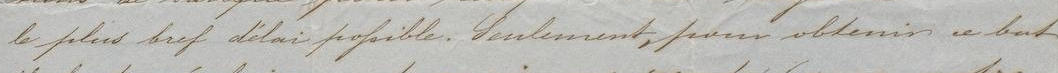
le plus bref délai possible. Seulement, pour obtenir ce but
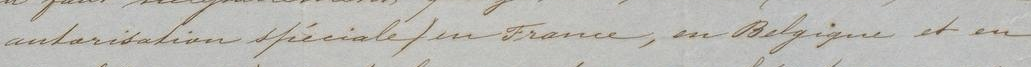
autorisation spéciale) en France, en Belgique et en
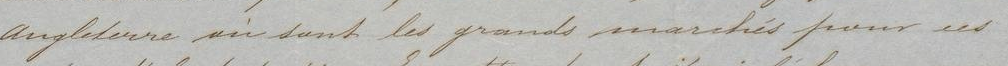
Angleterre où sont les grands marchés pour ces
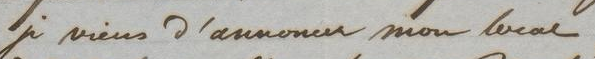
je viens d'annoncer mon bureau
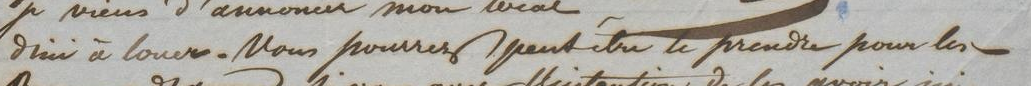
d'ici à louer. Vous pourrez peut-être le prendre pour les
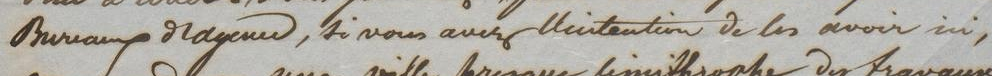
Bureaux d'agence, si vous avez l'intention de les avoir ici,
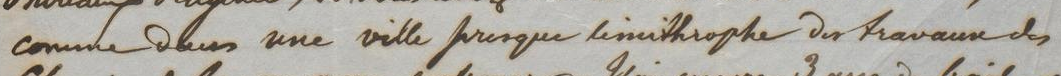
comme dans une ville presque limitrophe des travaux des
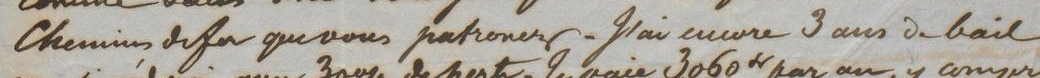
Chemins de fer que vous patronez – J'ai encore 3 ans de bail
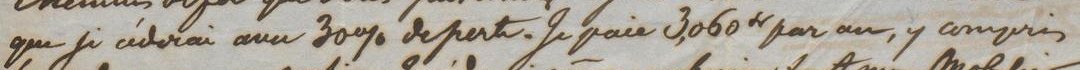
que je céderai avec 30% de perte. Je paie 3,060 fr par an, y compris
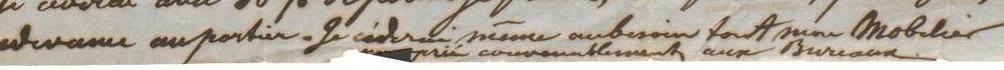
redevance au portier. Je céderai même au besoin tout mon Mobilier
